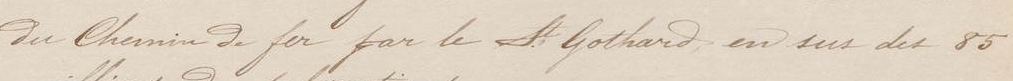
du Chemin de fer par le St Gothard, en sus des 85
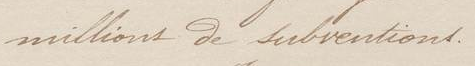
millions de subventions.
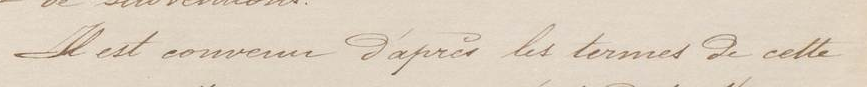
Il est convenu d'après les termes de cette
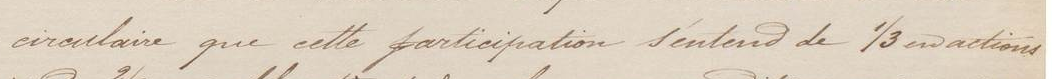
circulaire que cette participation s'entend de ⅓ en actions
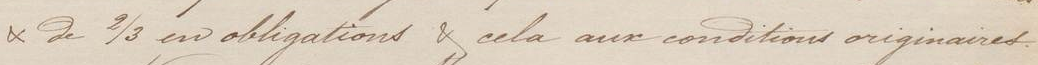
& de ⅔ en obligations & cela aux conditions originaires.
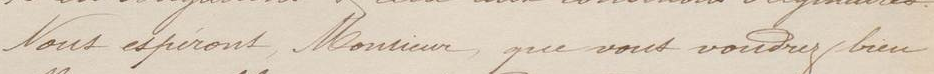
Nous espérons, Monsieur, que vous voudrez bien
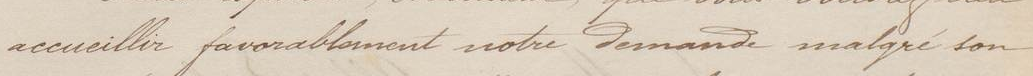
accueillir favorablement notre demande malgré son
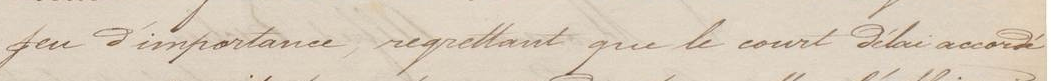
feu d'importance regrettant que le court délai accordé
